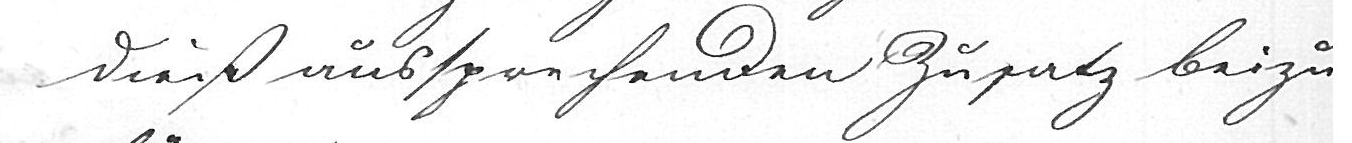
dieß aussprechenden zusatz beizu
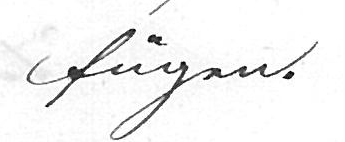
fügen.
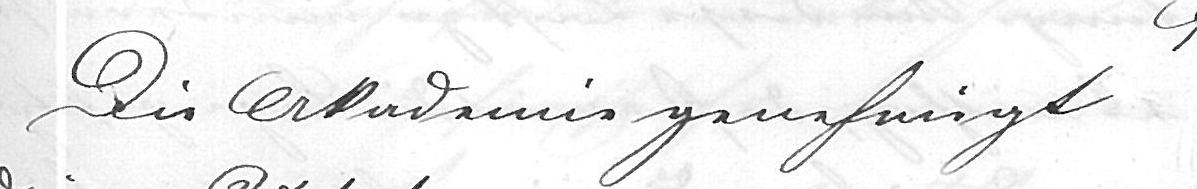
Die Akademie genehmigt
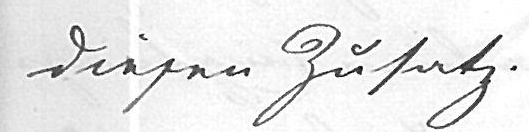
diesen Zusatz.
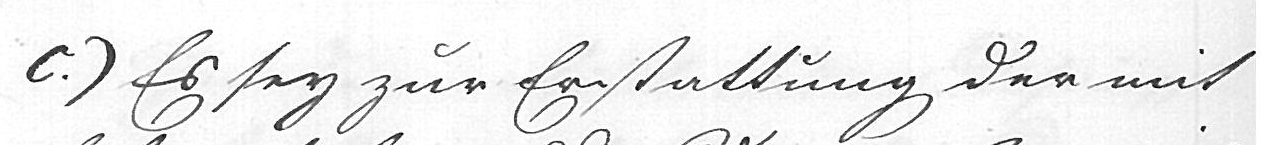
c) Es sey zur Erstattung der mit
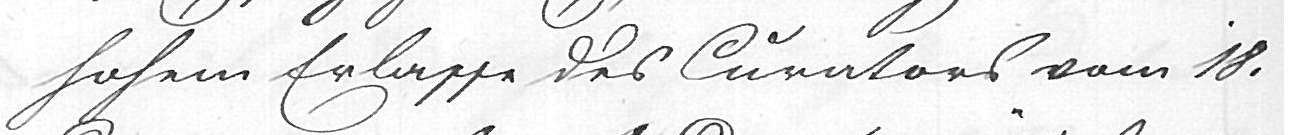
hohem Erlasse des Curators vom 18.
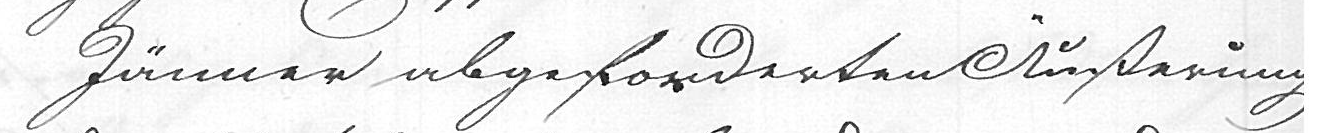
Jänner abgeforderten Äußerung
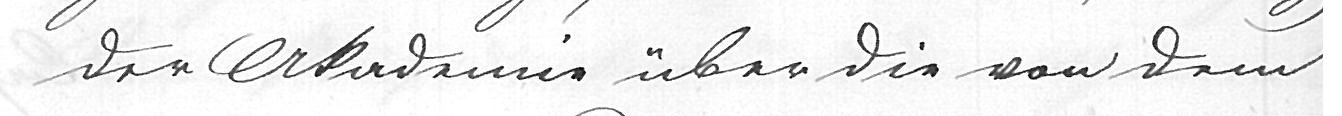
der Akademie über die von dem
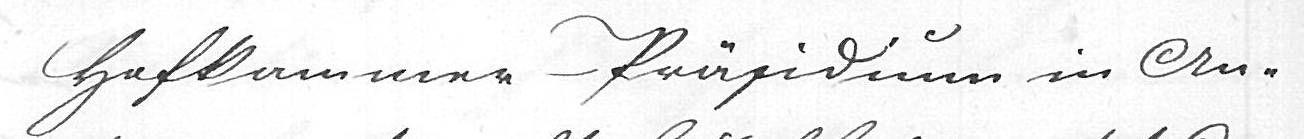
Hofkammer-Präsidium in An-
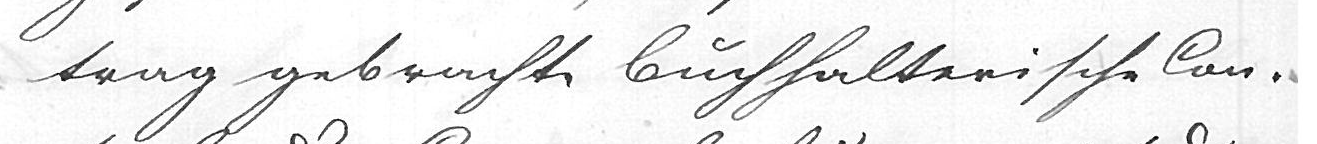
trag gebrachte buchhalterische Con-
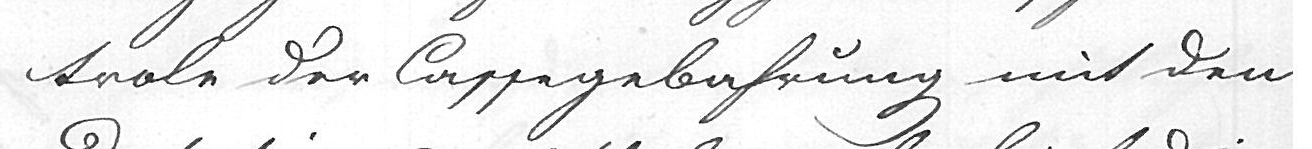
trole der Cassegebahrung mit den
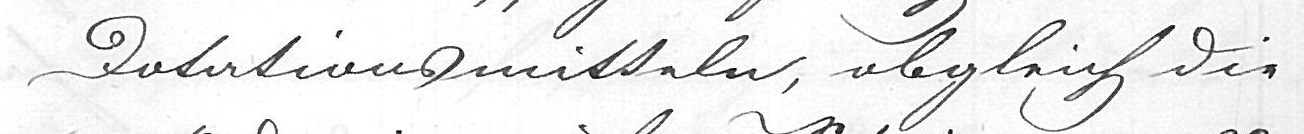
Dotationsmitteln, obgleich die
